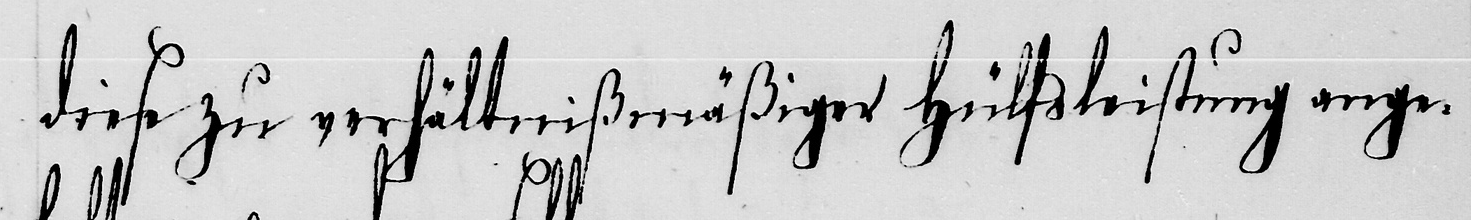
diese zu verhältnißmäßiger Hülfsleistung ange¬
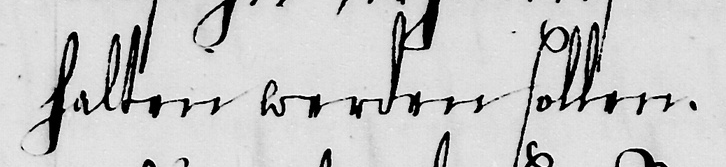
halten werden sollen.
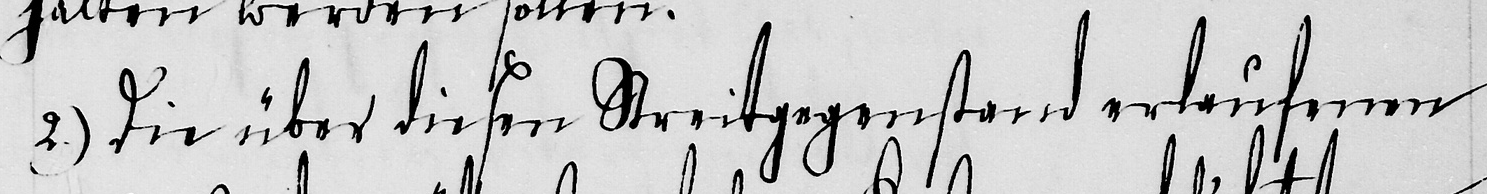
2.) Die über diesen Streitgegenstand erlaufenen
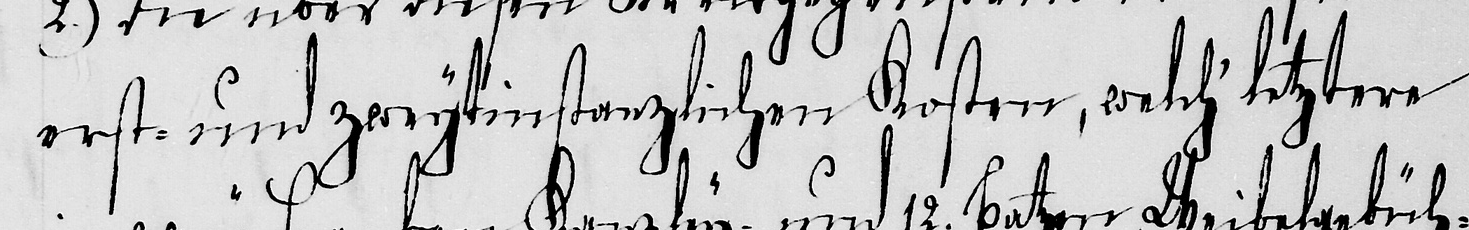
erst- und zweytinstanzlichen Kosten, welch’ letztere
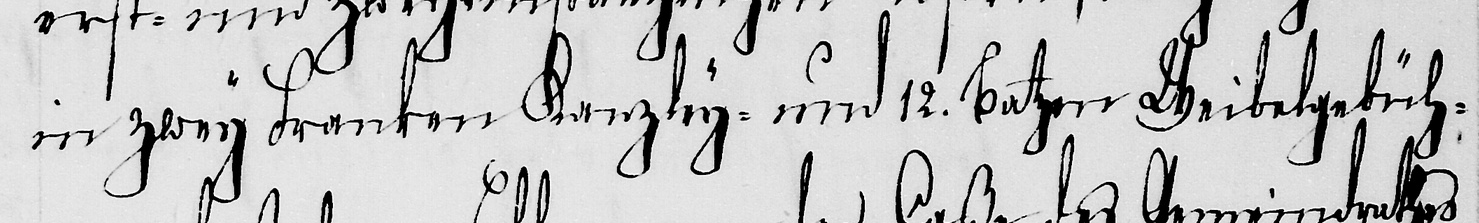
in zwey Franken Kanzley- und 12. Batzen Weibelgebüh¬
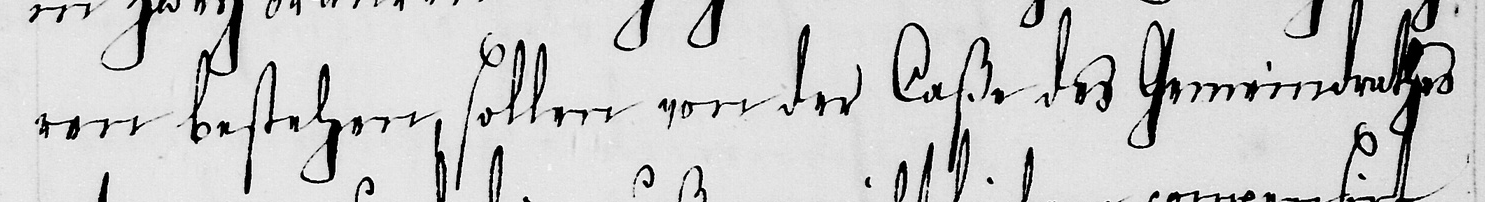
ren bestehen, sollen von der Caße des Gemeindrathes
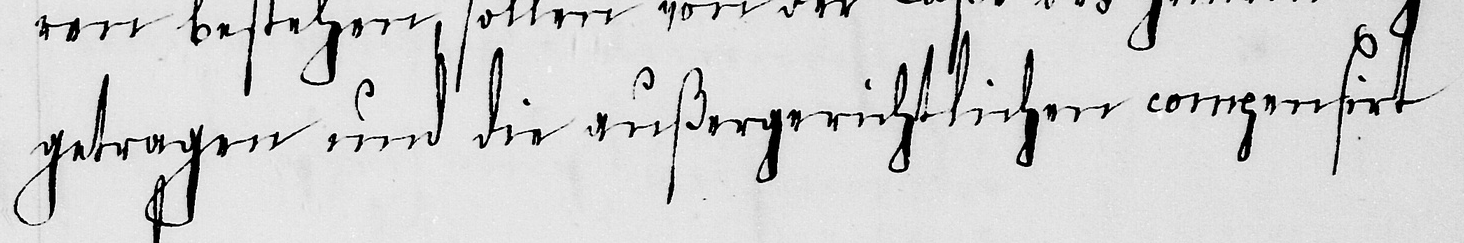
getragen und die außergerichtlichen compensirt
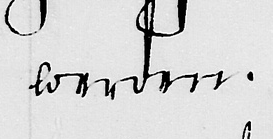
werden.
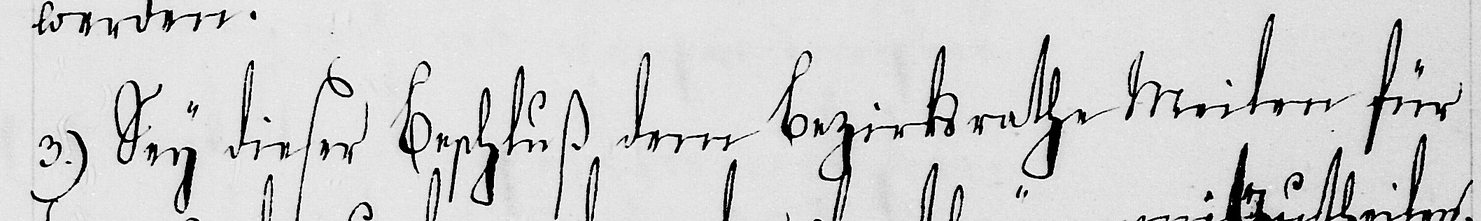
3.) Sey dieser Beschluß dem Bezirksrathe Meilen für
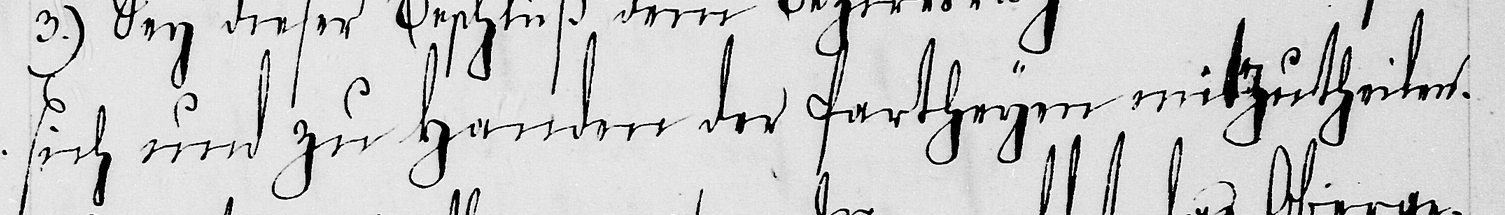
sich und zu Handen der Partheyen mitzutheilen.
